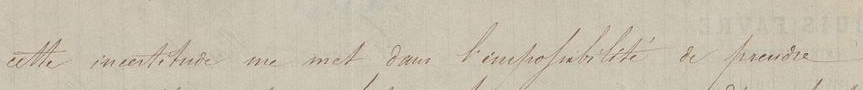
cette incertitude me met dans l'impossibilité de prendre
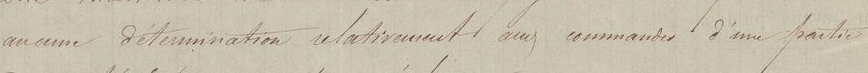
aucune détermination relativement aux commandes d'une partie
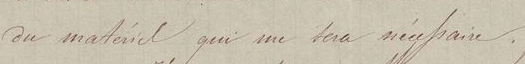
du matériel qui me sera nécessaire.
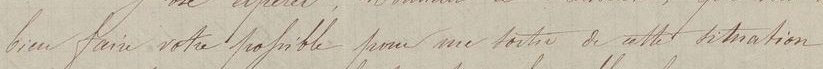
bien faire votre possible pour me sortir de cette situation
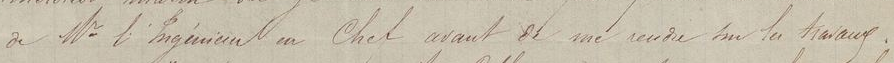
de Mr l'Ingénieur en Chef avant de me rendre sur les travaux.
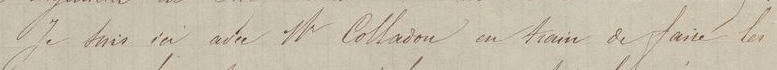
Je suis ici avec MrColladon en train de faire les
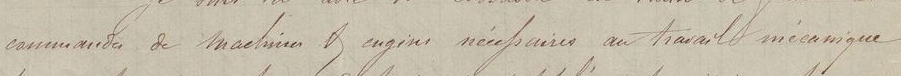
commandes de machines & engins nécessaires au travail mécanique
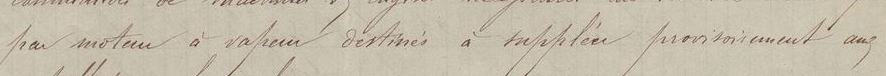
par moteur à vapeur destinés à suppléer provisoirement aux
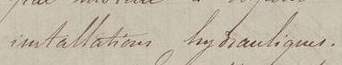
installations hydrauliques.
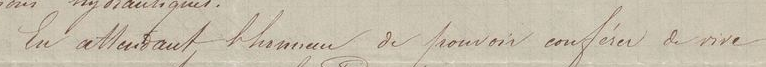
En attendant l'honneur de pouvoir conférer de vive
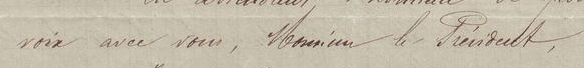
voix avec vous, Monsieur le Président,
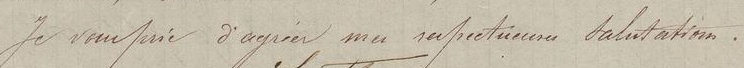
Je vous prie d'agréer mes respectueuses salutations.
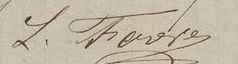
L. Favre
